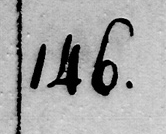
45.
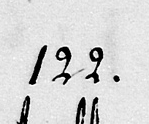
1822.
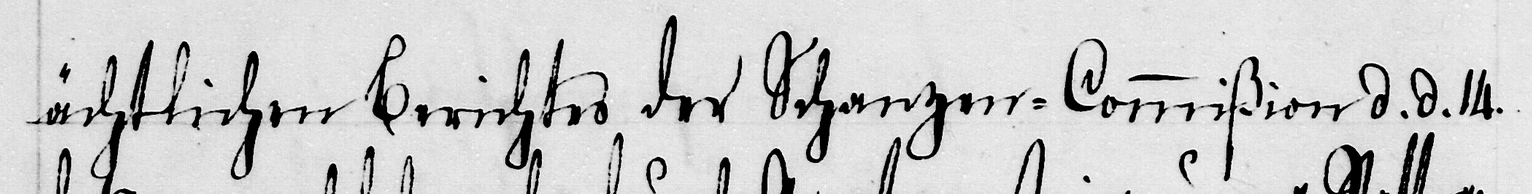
ächtlichen Berichtes der Schanzen-Commißion d. d. 14.
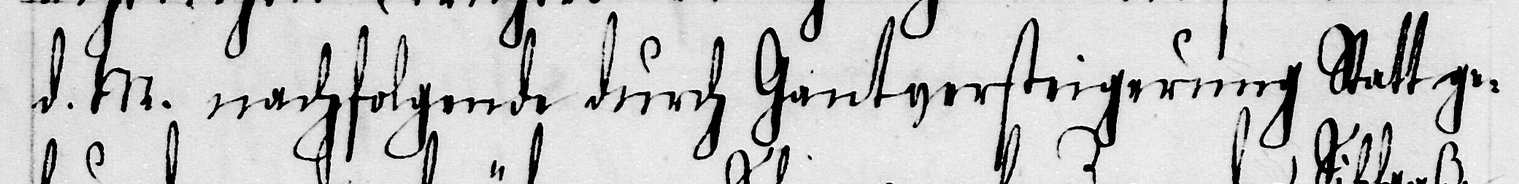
d. M. nachfolgende durch Gantversteigerung Statt g¬
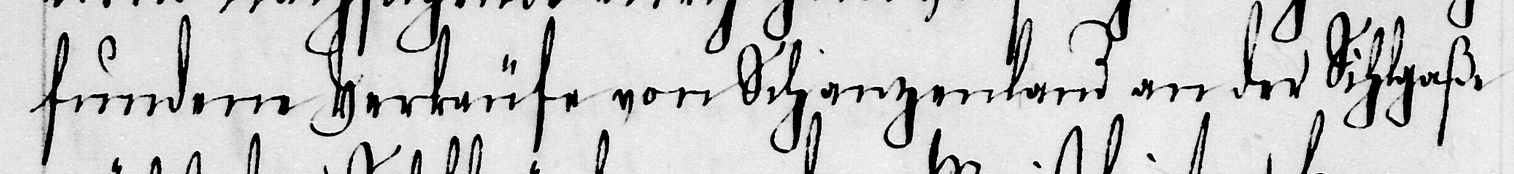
efundene Verkäufe von Schanzenland an der Sihlgaße
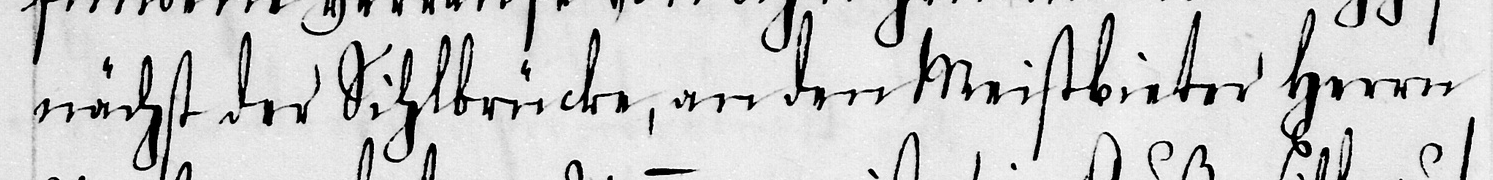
nächst der Sihlbrücke, an den Meistbieter Herrn
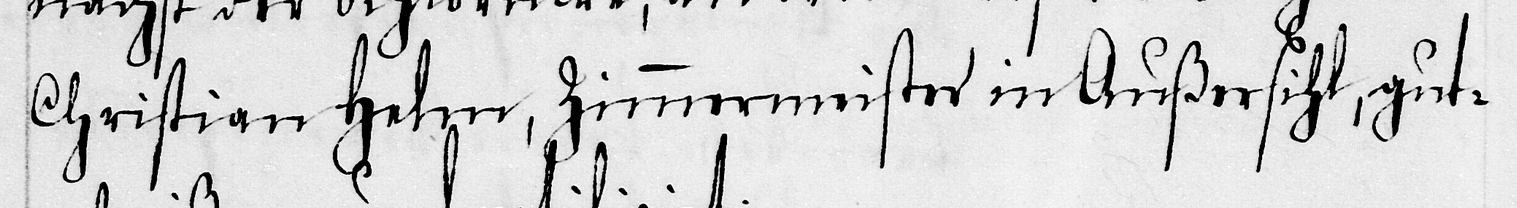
Christian Helm, Zimmermeister in Außersihl, gut¬
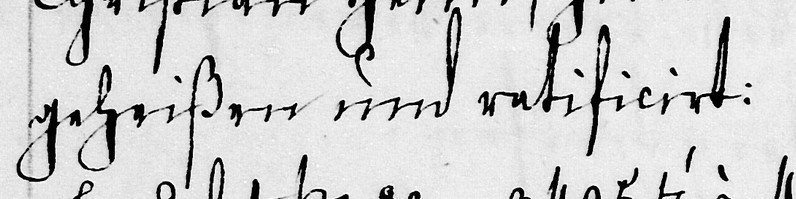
geheißen und ratificirt:
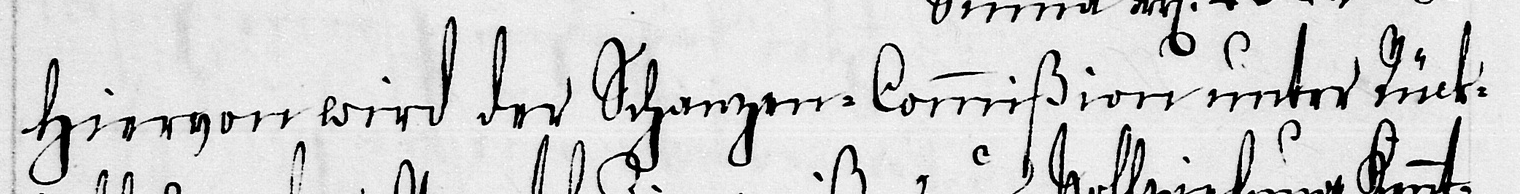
Hiervon wird der Schanzen-Commißion unter Rück¬
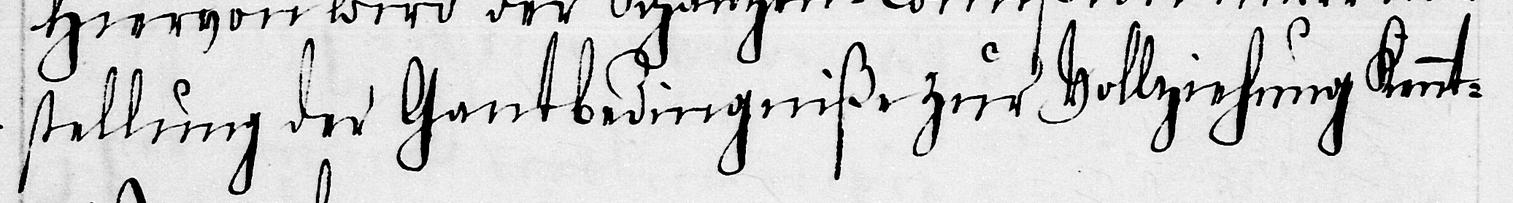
stellung der Gantbedingniße zur Vollziehung Kennt¬
